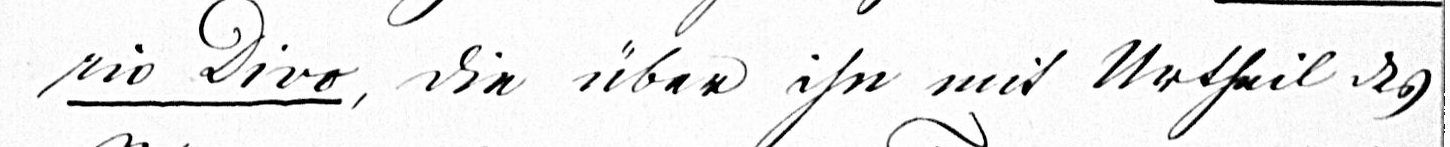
rio Divo, die über ihn mit Urtheil des
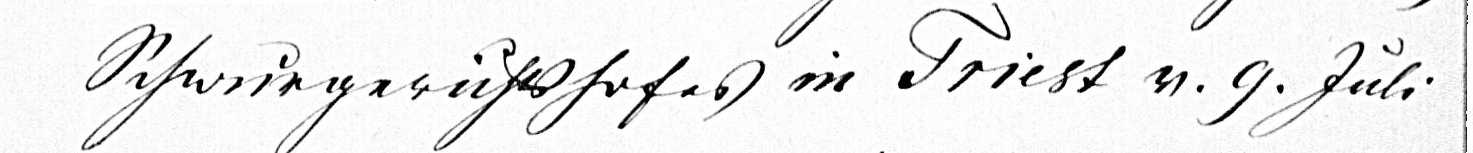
Schwurgerichtshofes in Triest v. 9. Juli
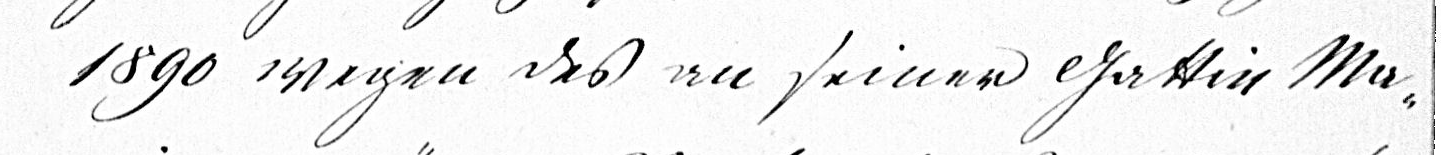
1890 wegen des an seiner Gattin Ma¬
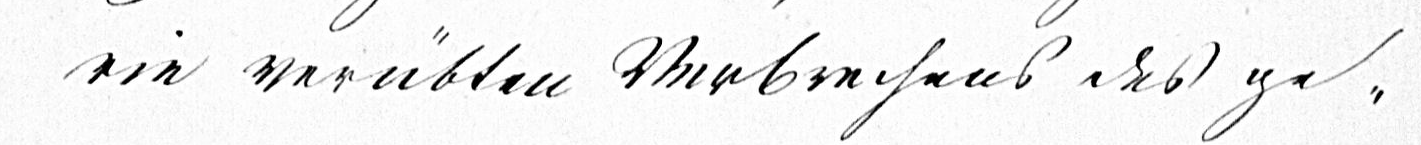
rie verübten Verbrechens des ge¬
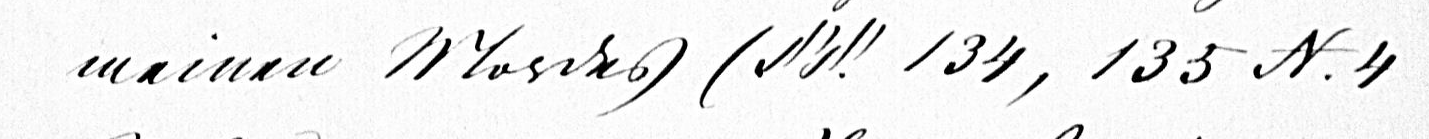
meinen Mordes (§§. 134, 135 N. 4
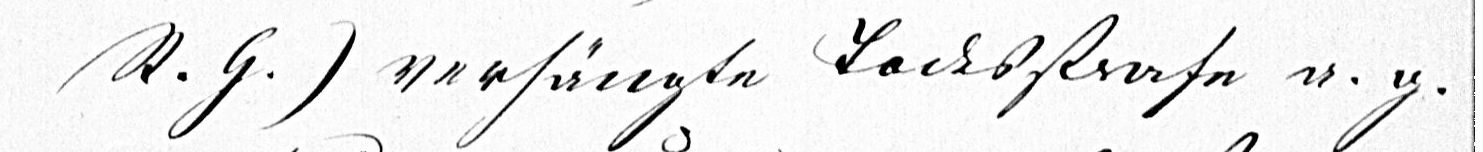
R. G.) verhängte Todesstrafe a. g.
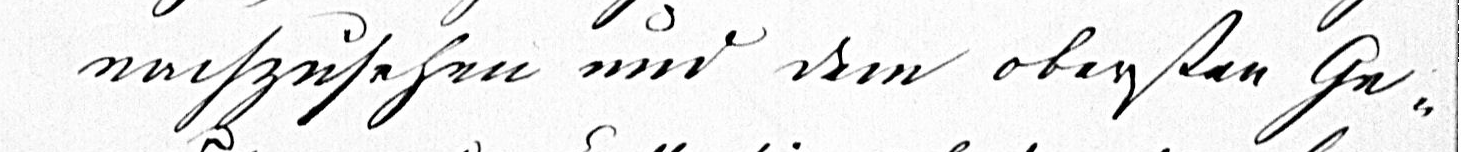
nachzusehen und dem obersten Ge¬
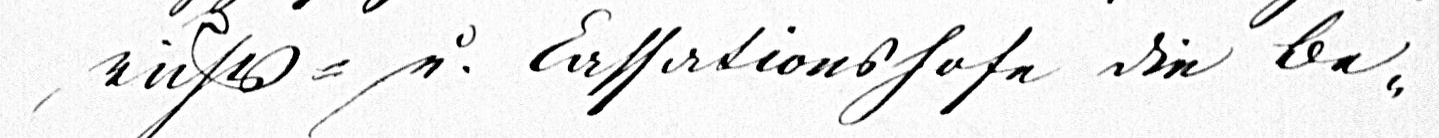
richts- u. Cassationshofe die Be¬
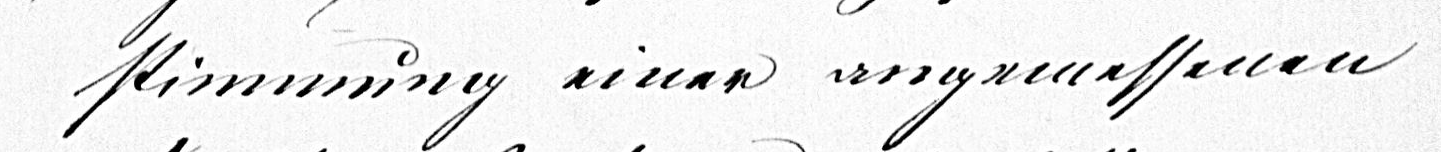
stimmung einer angemessenen
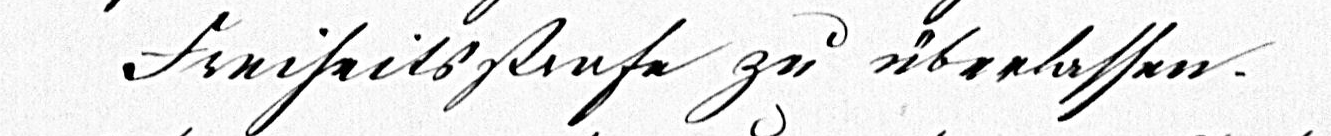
Freiheitstrafe zu überlassen.
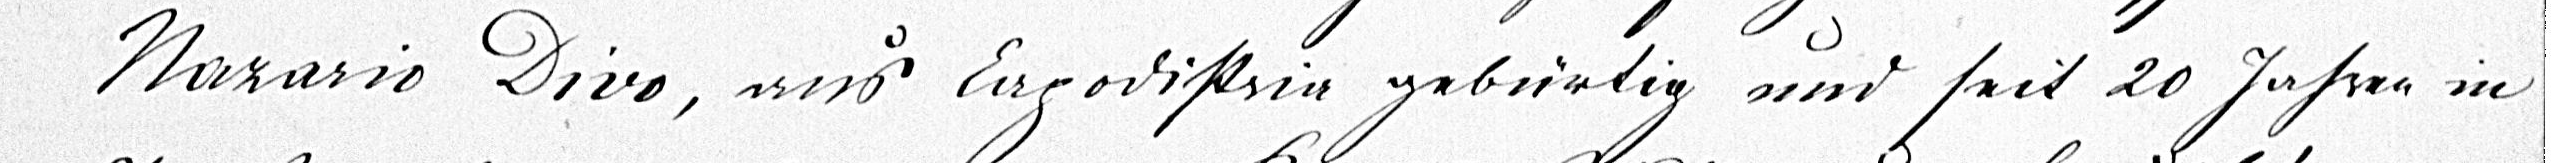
Nazario Divo, aus xxapodistria gebürtig und seit 20 Jahren in
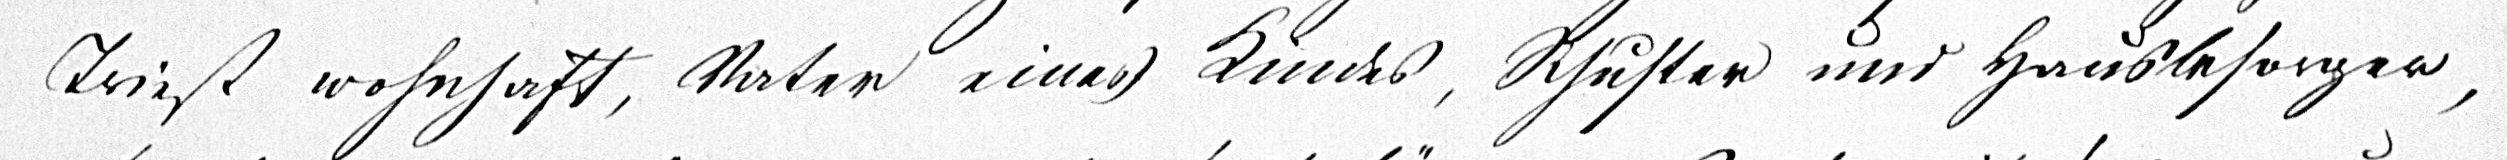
Triest wohnhaft, Vater eines Kindes, Schuster und Hausbesorger,
